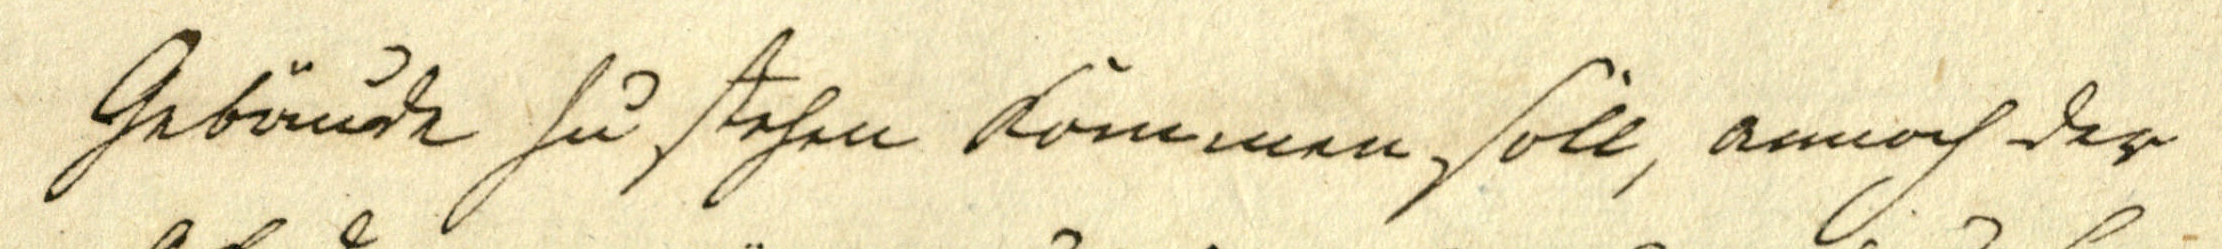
Gebäude zu stehen kommen soll, annoch der
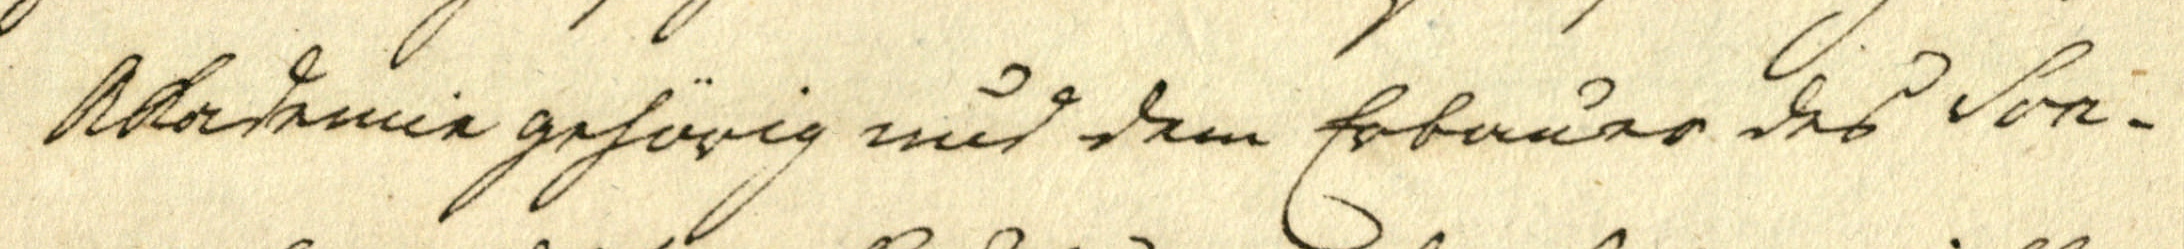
Akademie gehörig und dem Erbauer des Son¬
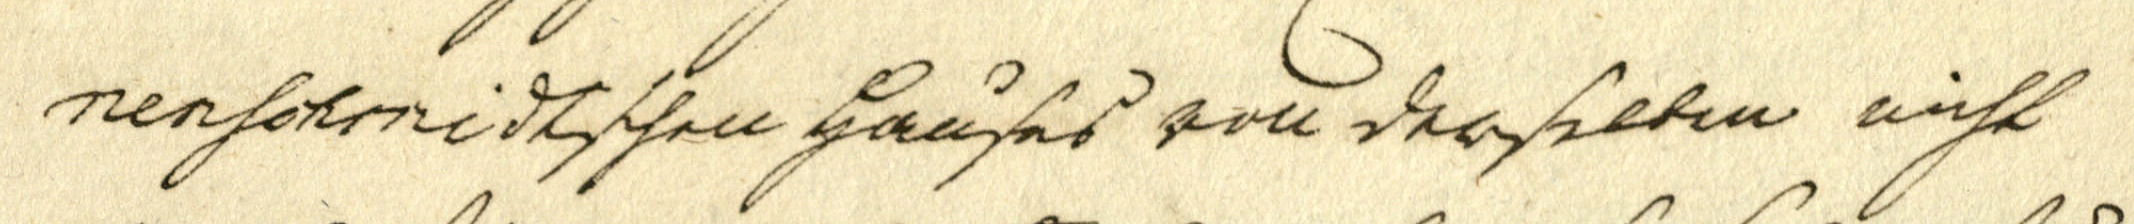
nenschmidtschen Hauses von derselben nicht
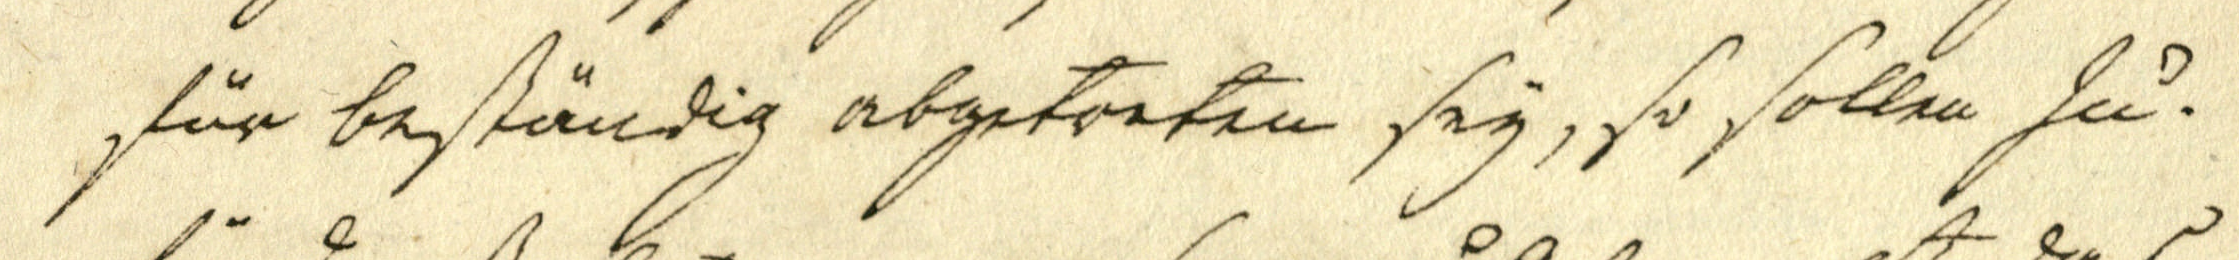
für beständig abgetreten seÿ, so sollen zu¬
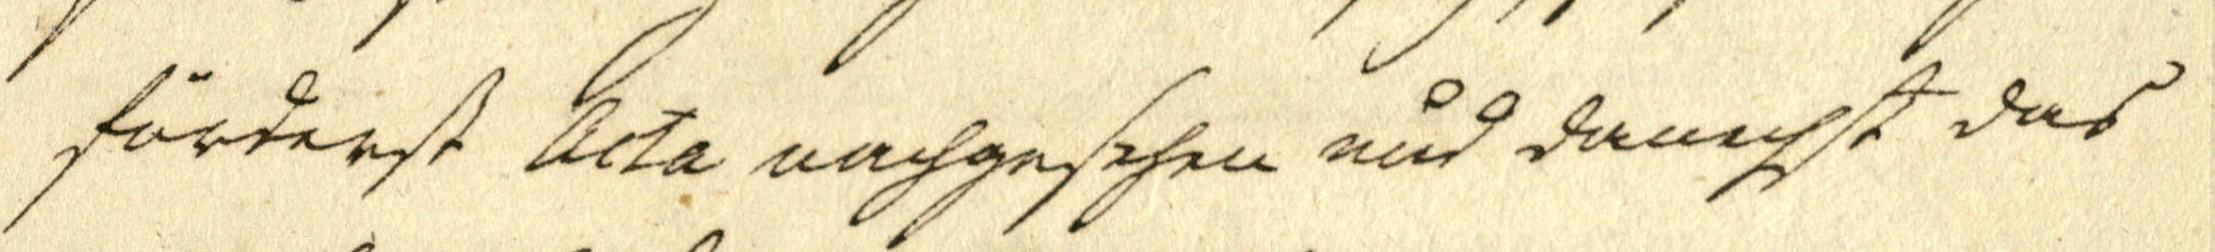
förderst Acta nachgesehen und danechst das
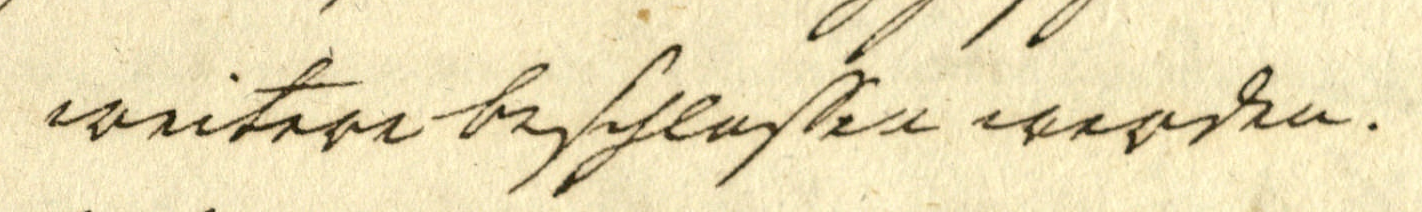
weitere beschlossen werden.
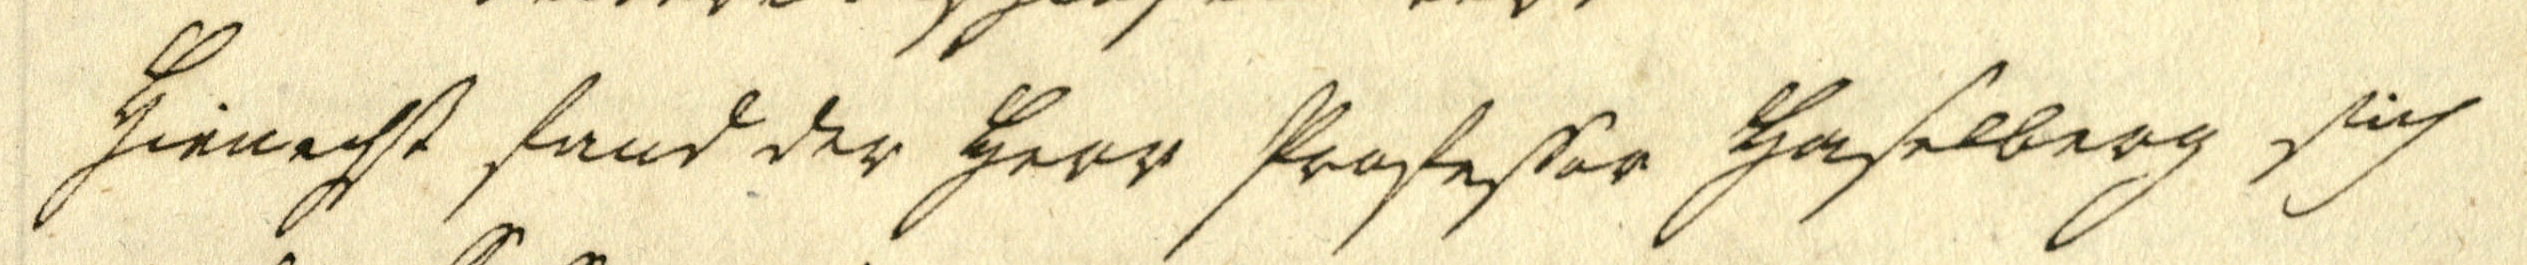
Hienechst fand der Herr Professor Haselberg sich
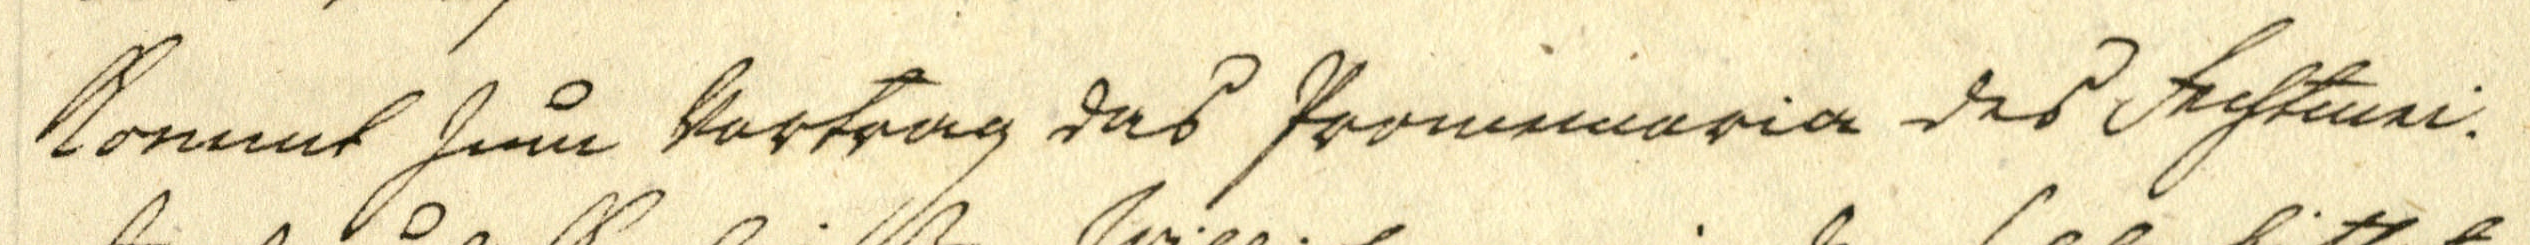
2., Kommt zum Vortrag Promemoria des Fechtmei¬
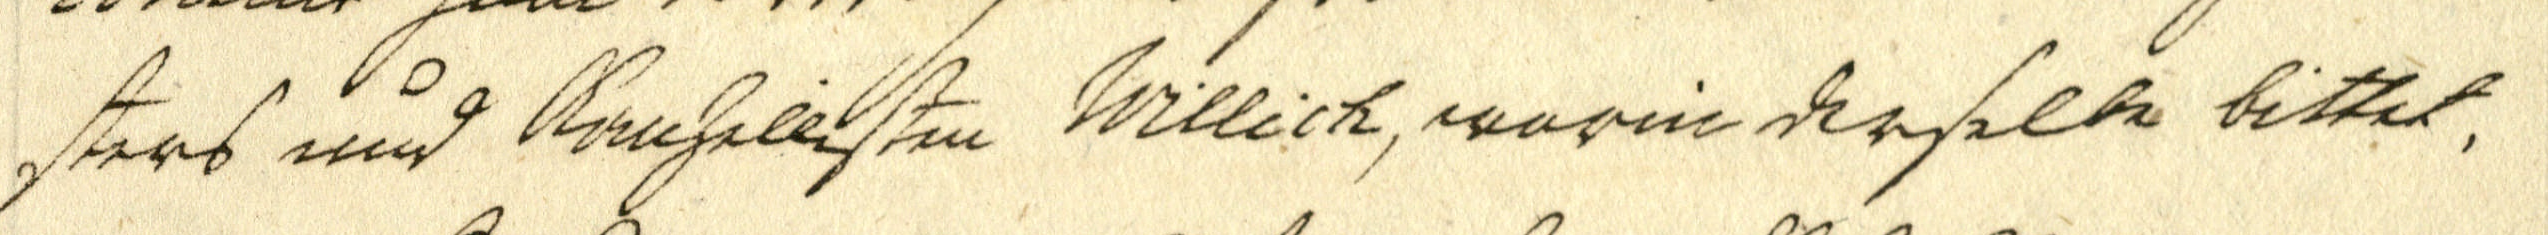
sters und Kanzellisten Willich, worin derselbe bittet,
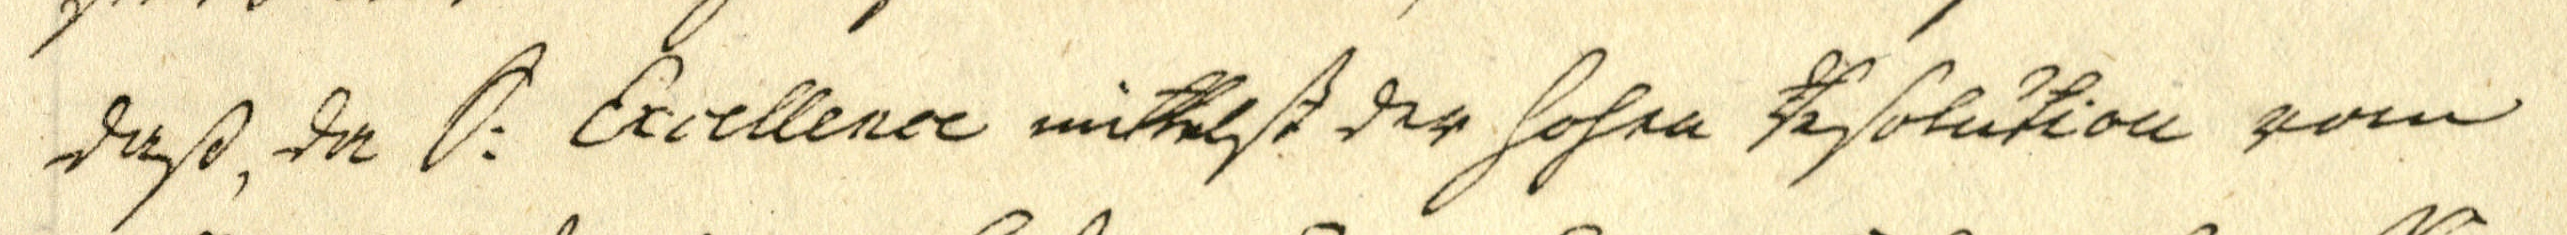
daß, da S. Excellence mittelst der hohen Resolution vom
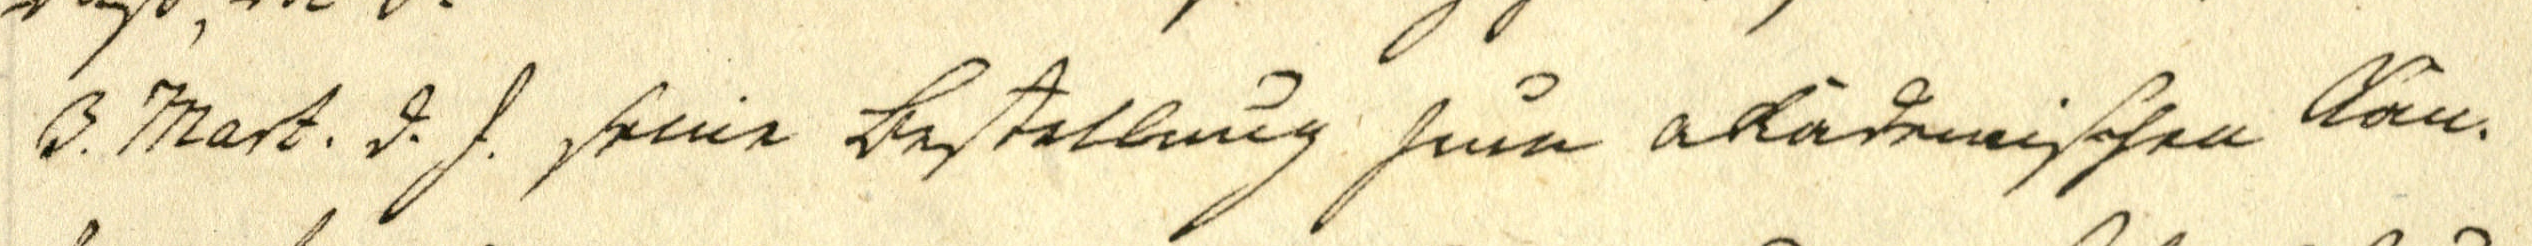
3. Mart. d. J. seine Bestellung zum akademischen Kan¬
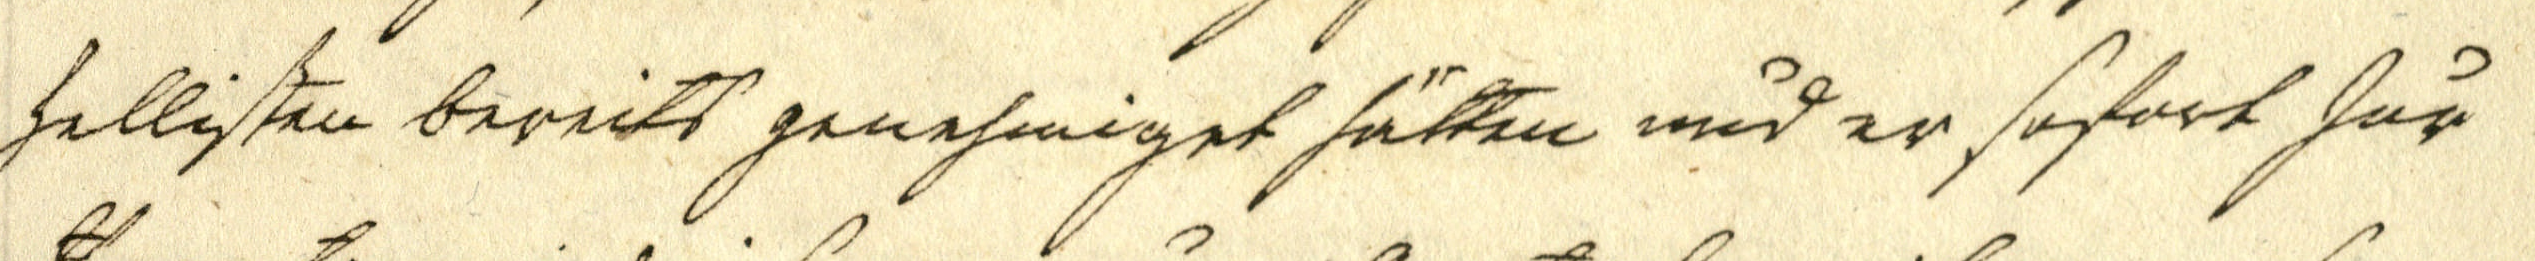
zellisten bereits genehmiget hätten und er sofort zur
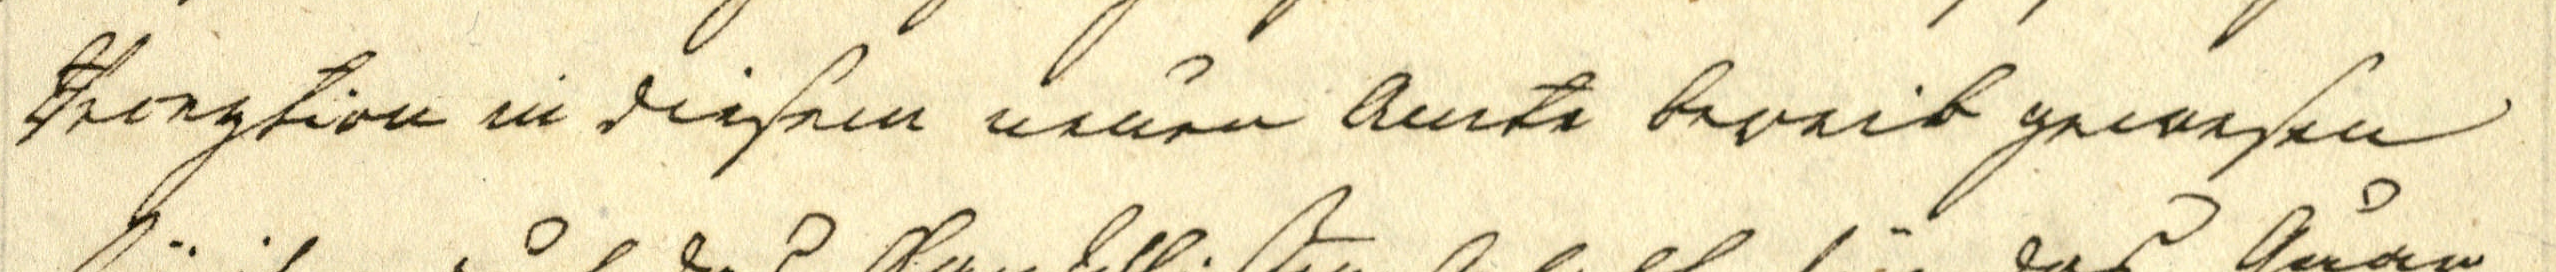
Reception in diesem neuen Amte bereit gewesen
